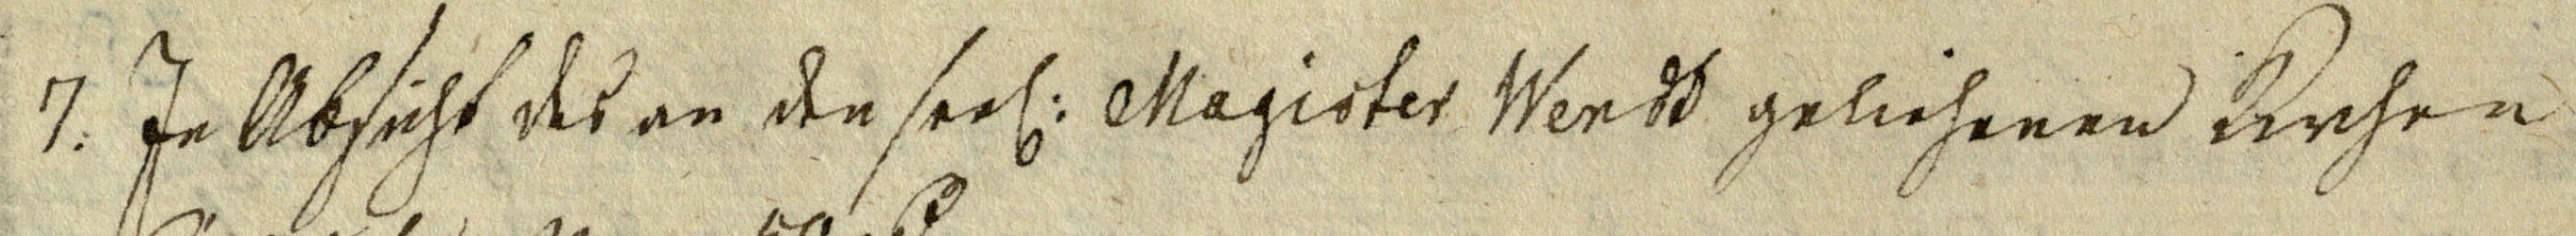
7. In Absicht des an den seel. Magister Wendt geliehenen Kirchen
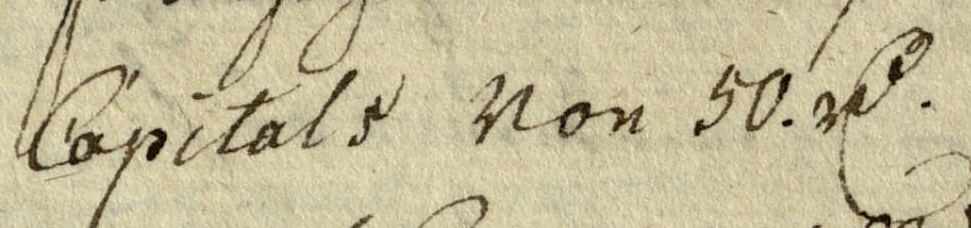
Capitals von 50 r.
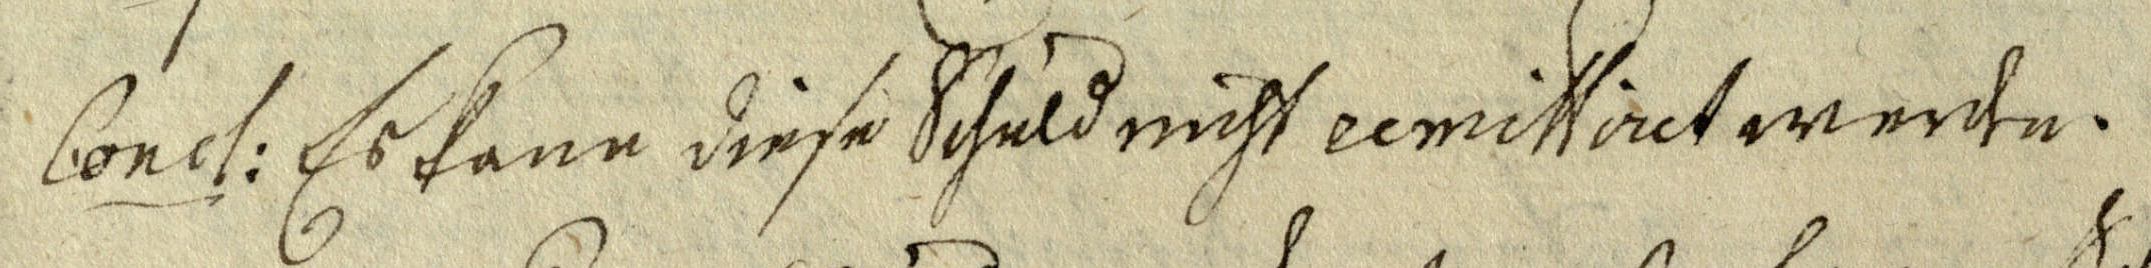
Concl. Es kann diese Schuld nicht remittiret werden.
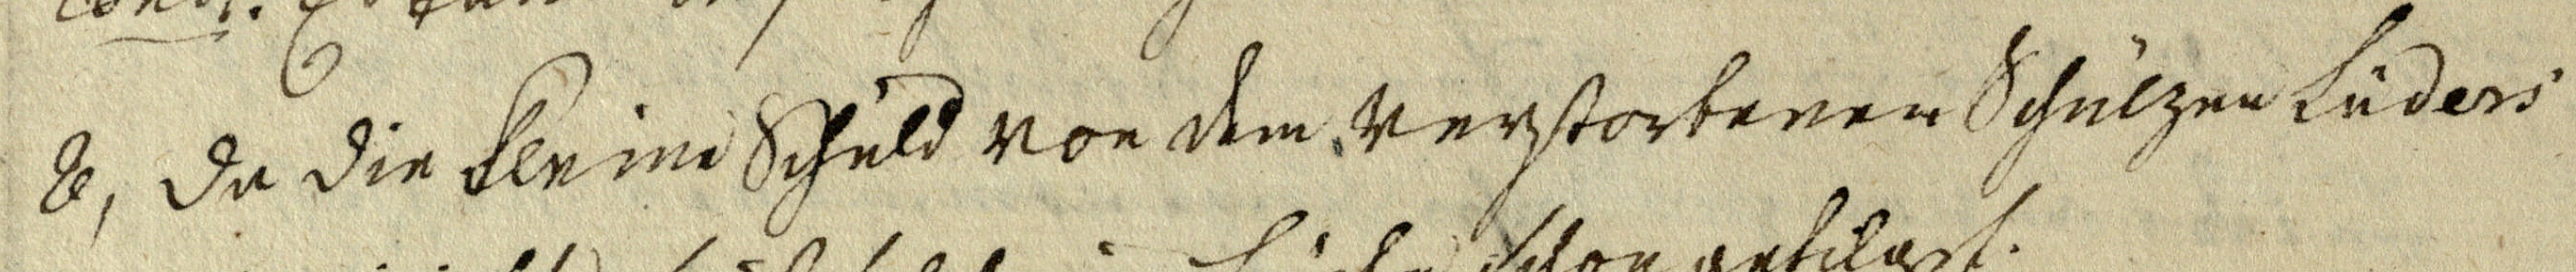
8. Da die kleine Schuld von dem verstorbenen Schulzen Lüders
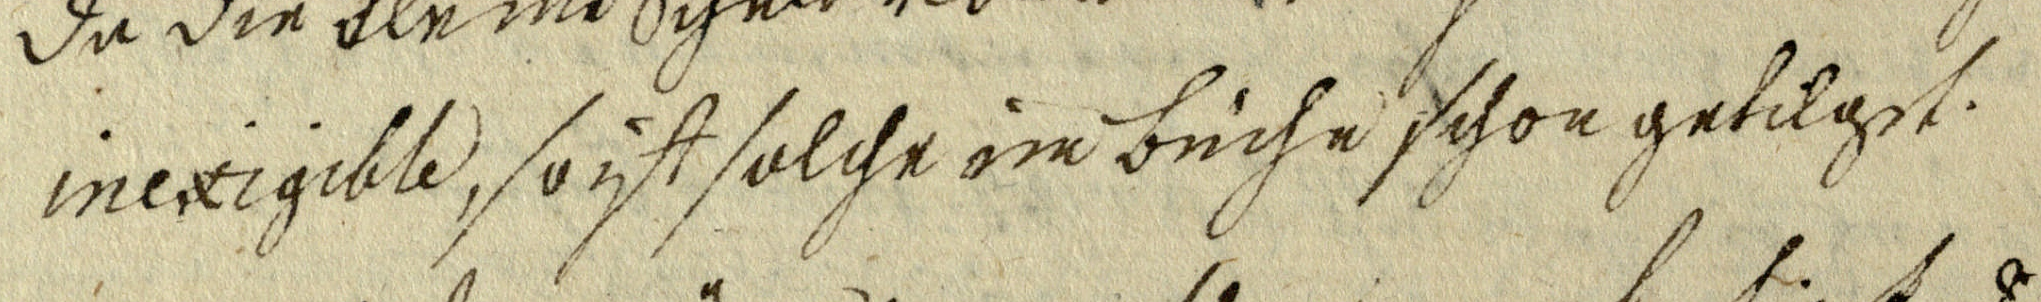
inexigible, so ist solche im Buche schon getilget.
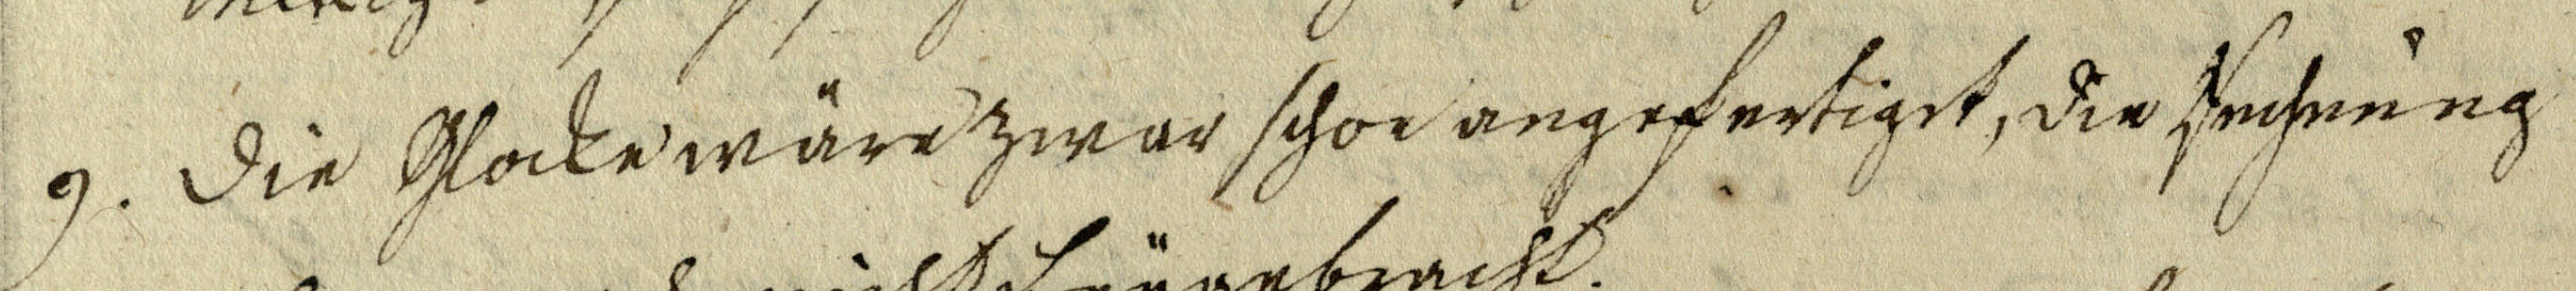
9. Die Glocke wäre zwar schon angefertiget, die Rechnung
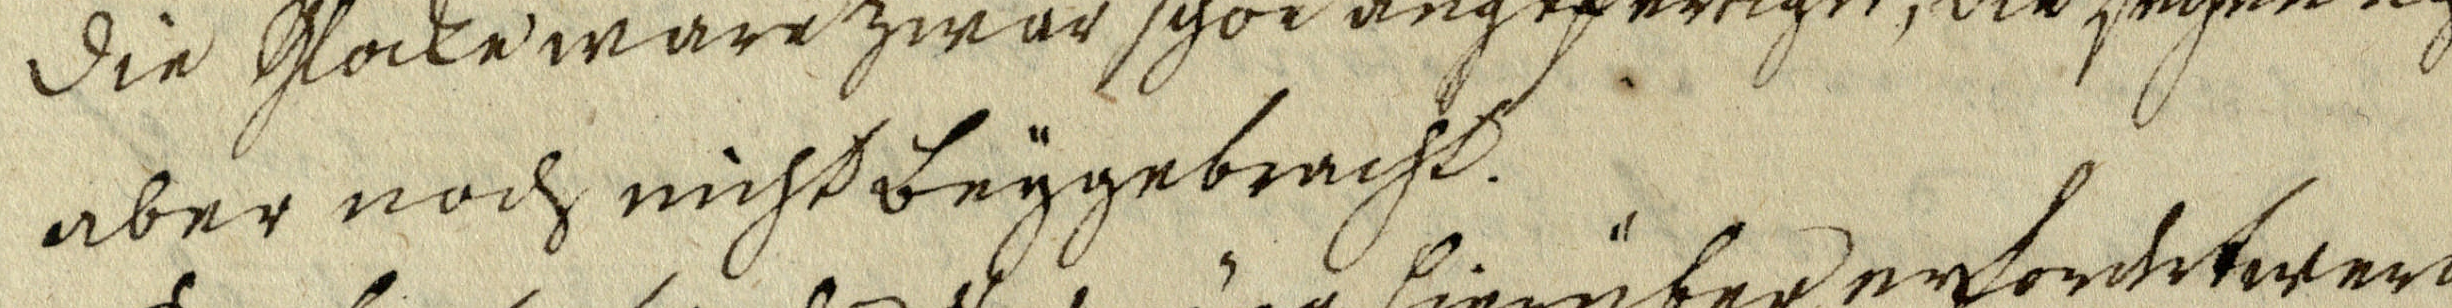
aber noch nicht beÿgebracht.
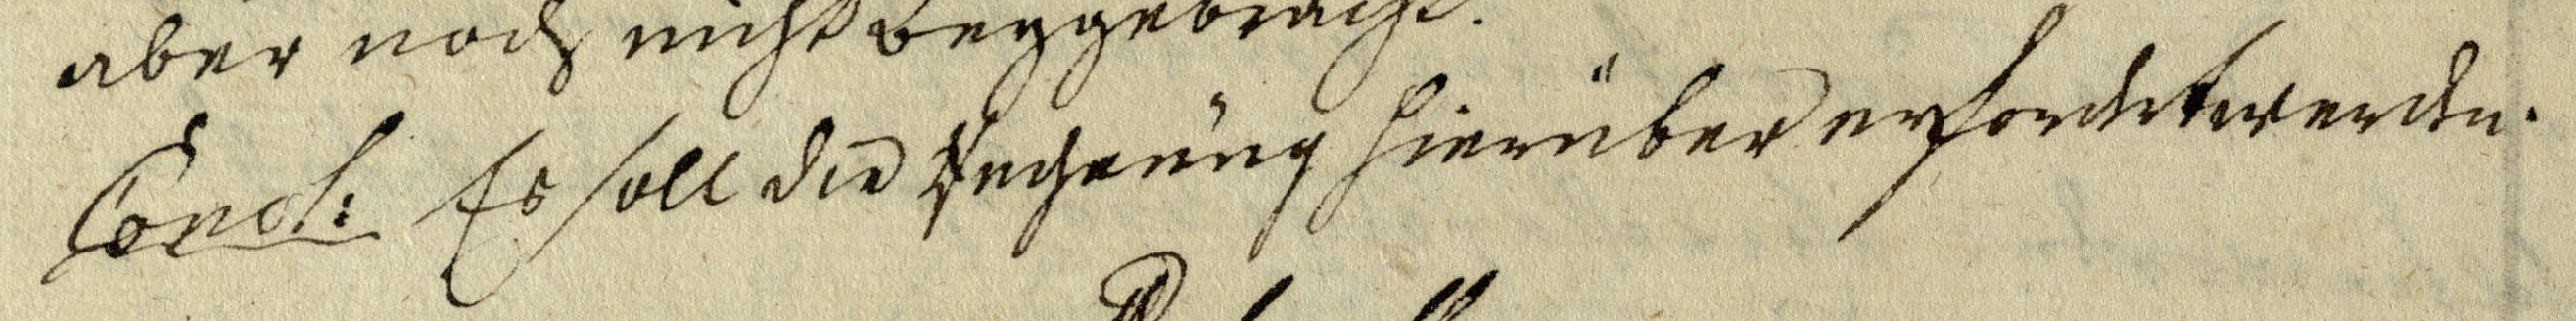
Concl. Es soll die Rechnung hierüber erfordert werden.
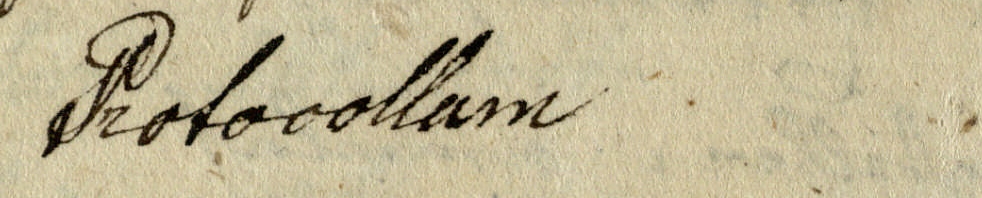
Protocollum
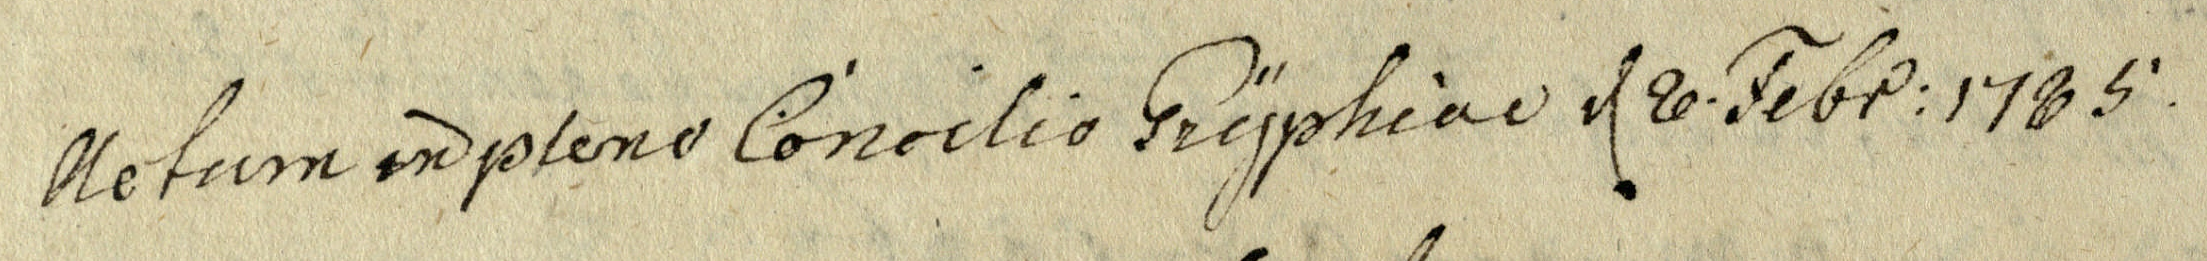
Actum in pleno Concilio Grÿphiae d. 8. Febr. 1785.
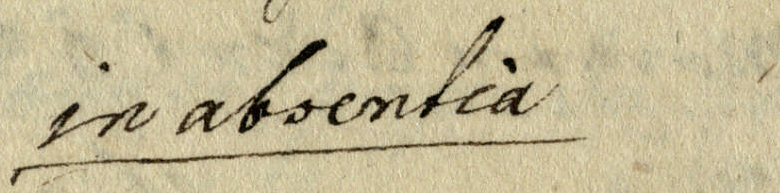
in absentia
